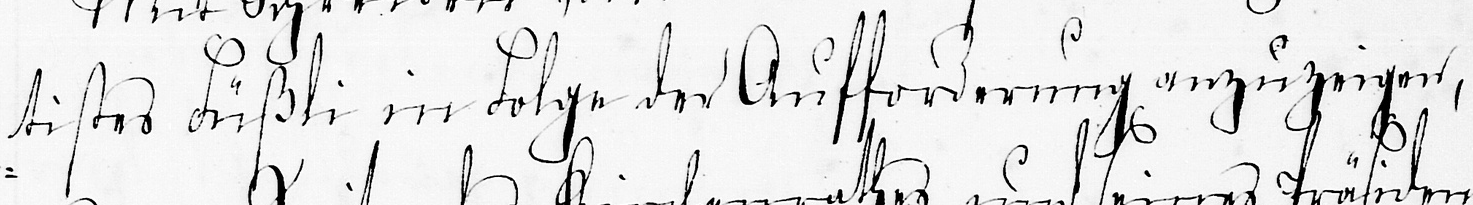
tistes Füßli in Folge der Aufforderung anzuzeigen,
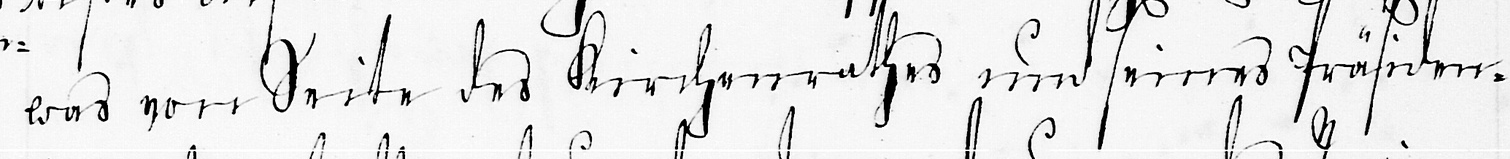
was von Seite des Kirchenrathes und seines Präsiden¬
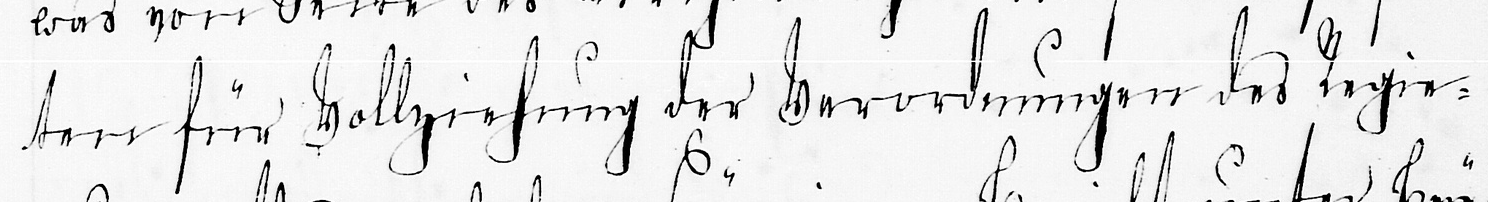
ten für Vollziehung der Verordnungen des Regie¬
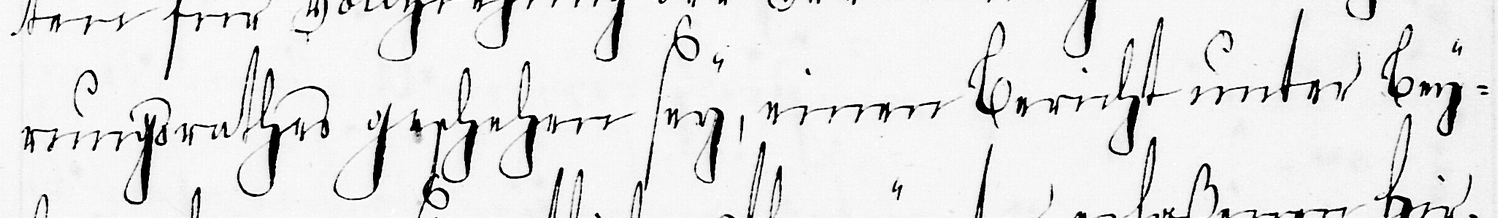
rungsrathes geschehen sey, einen Bericht unter Bey¬
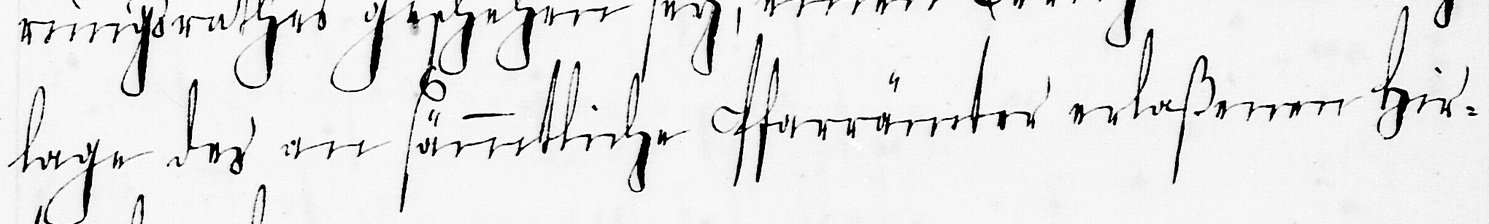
lage des an sämmtliche Pfarrämter erlaßenen Hir¬
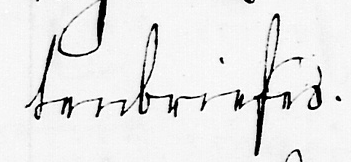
tenbriefes.
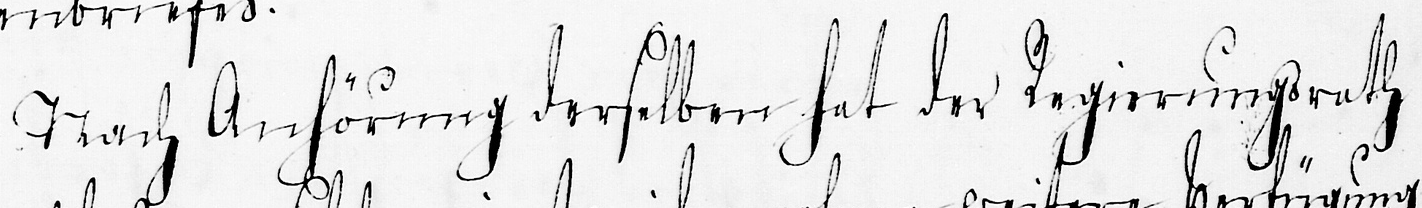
Nach Anhörung derselben hat der Regierungsrath
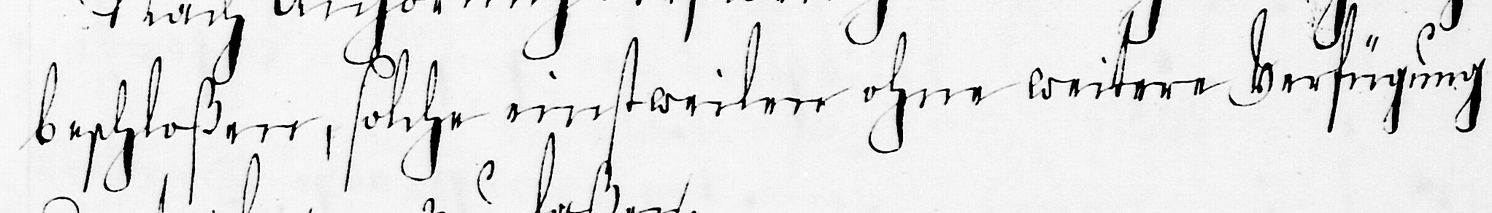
beschloßen, solche einstweilen ohne weitere Verfügung
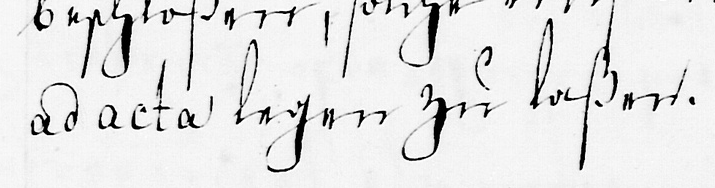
ad acta legen zu laßen.
